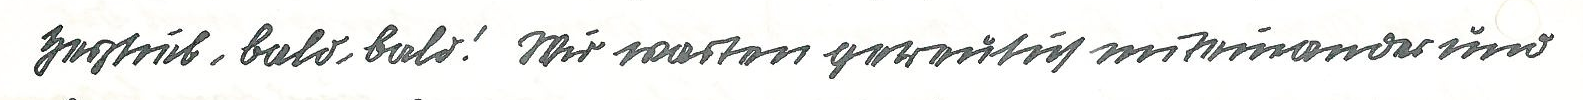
Herzlieb, bald, bald! Wir warten getreulich miteinander und
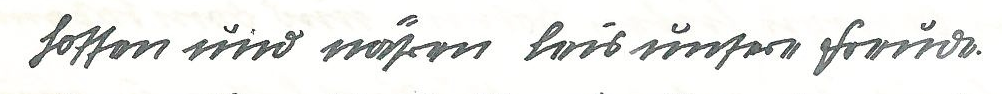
hoffen und nähren lieb unsere Freude.
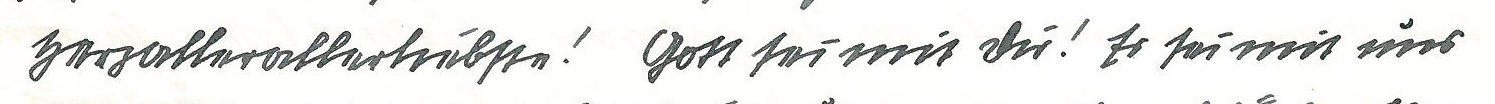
Herzallerallerliebste! Gott sei mir Dir! Er sei mit uns
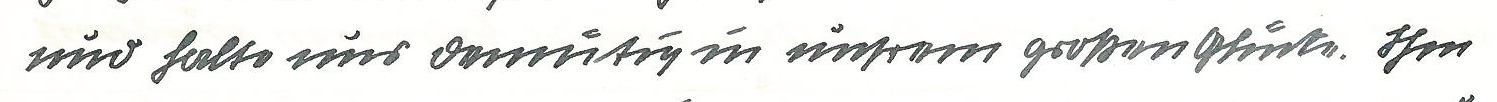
und halte uns demütig in unserem großen Glücke. Ihm
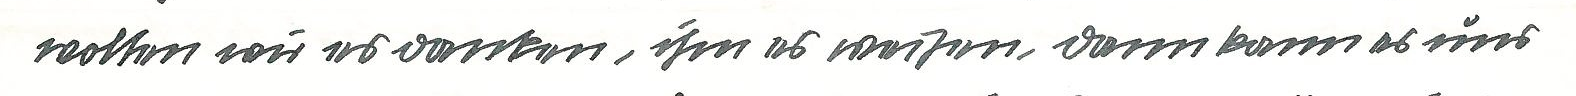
wollen wir es danken, ihm es weisen, dann kann es uns
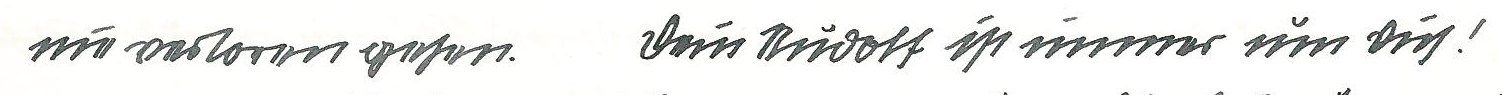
nie verloren gehen. Dein ist immer um Dich!
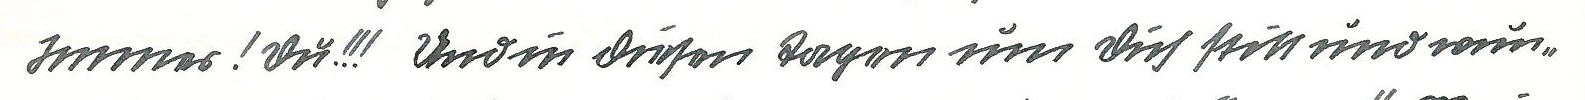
Immer! Du!!! Und in diesen Tagen nun Dich still und wun¬
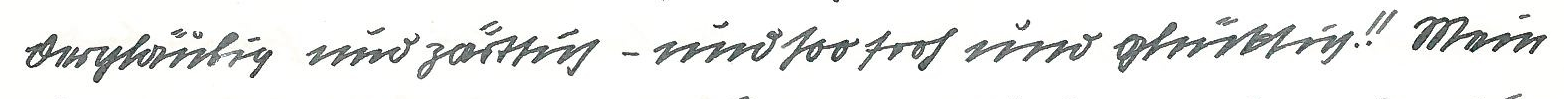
dergläubig und zärtlich – und soo froh und glücklich!! Mein
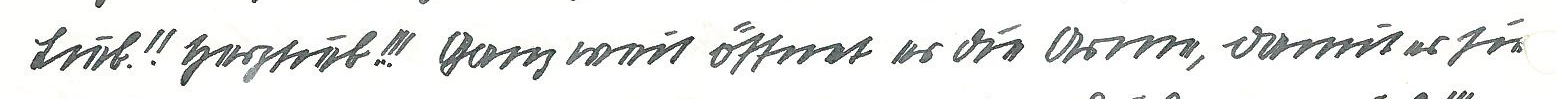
Lieb!! Herzlieb!!! Ganz weit öffnet er die Arme, damit er sie
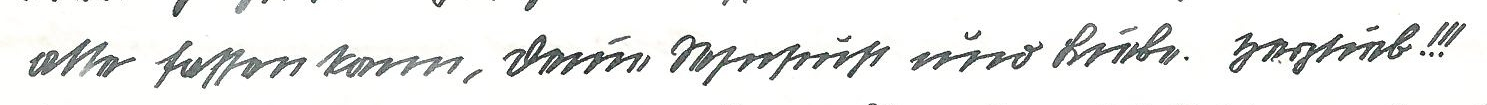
alle fassen kann, Deine Sehnsucht und Liebe. Herzlieb!!!
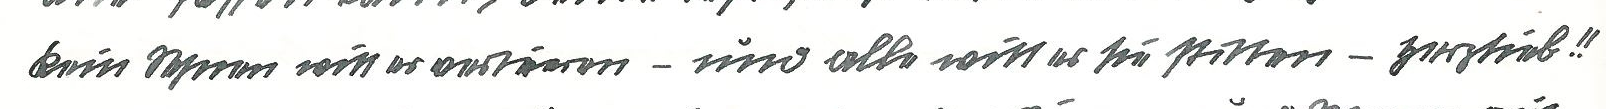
Kein Sehnen will er verlieren – und alle will er sie stillen – Herzlieb!!
